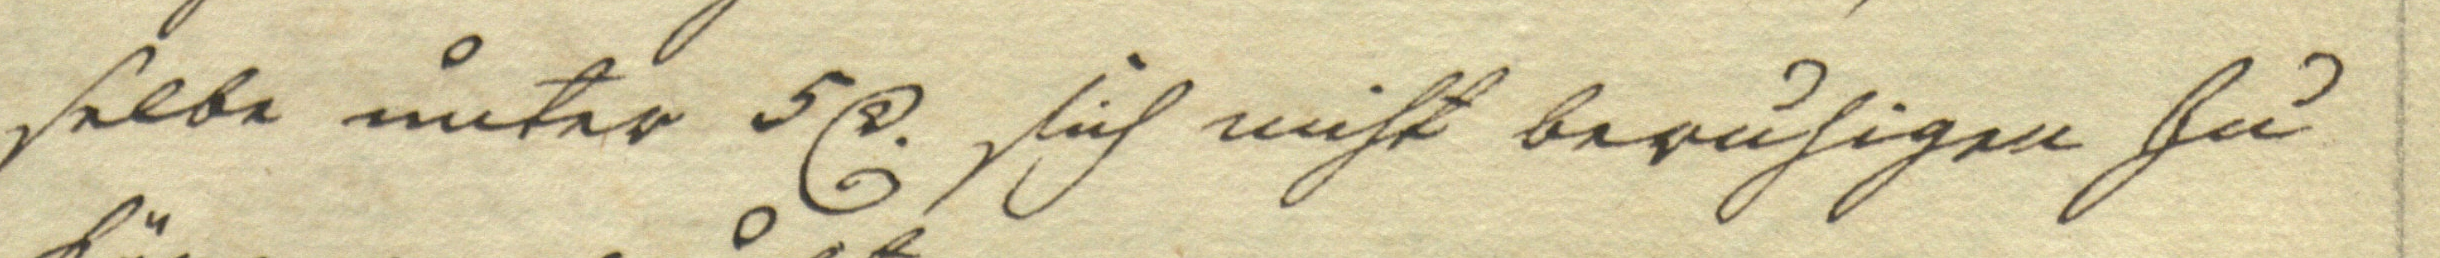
selbe unter 5 l. sich nicht beruhigen zu
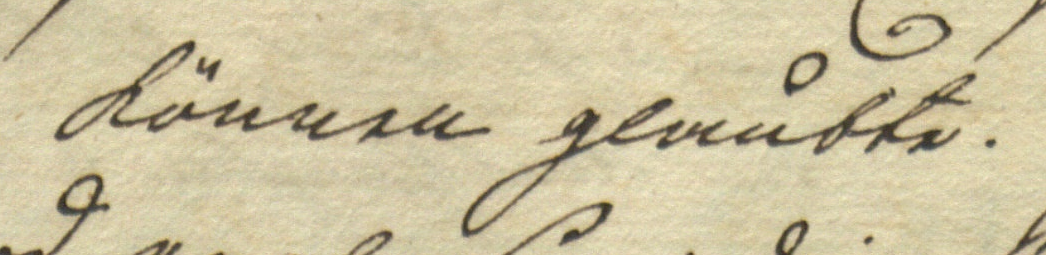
können glaubte.
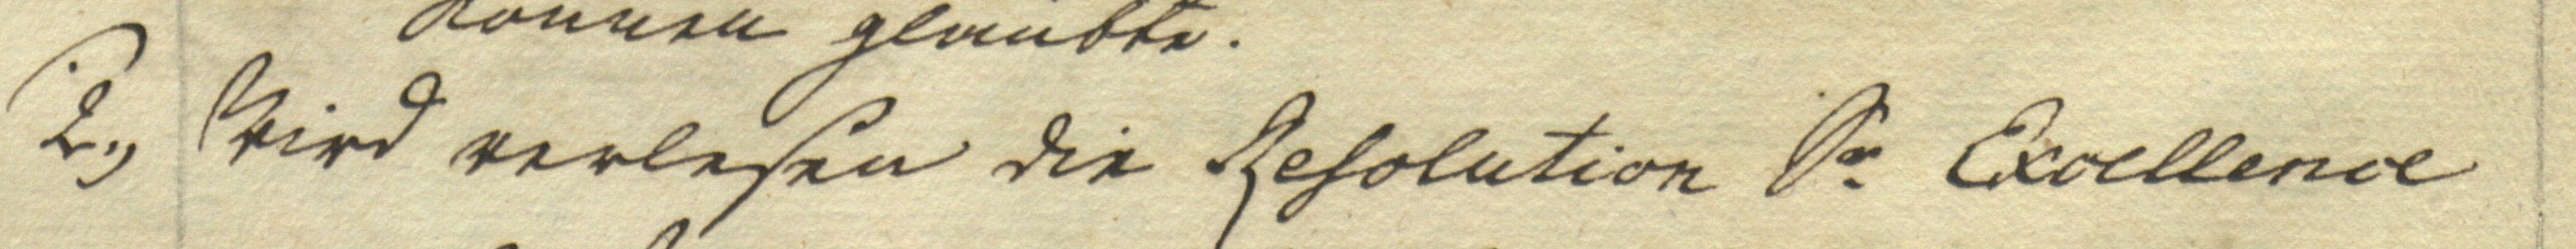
2., Wird verlesen die Resolution Sr Excellence
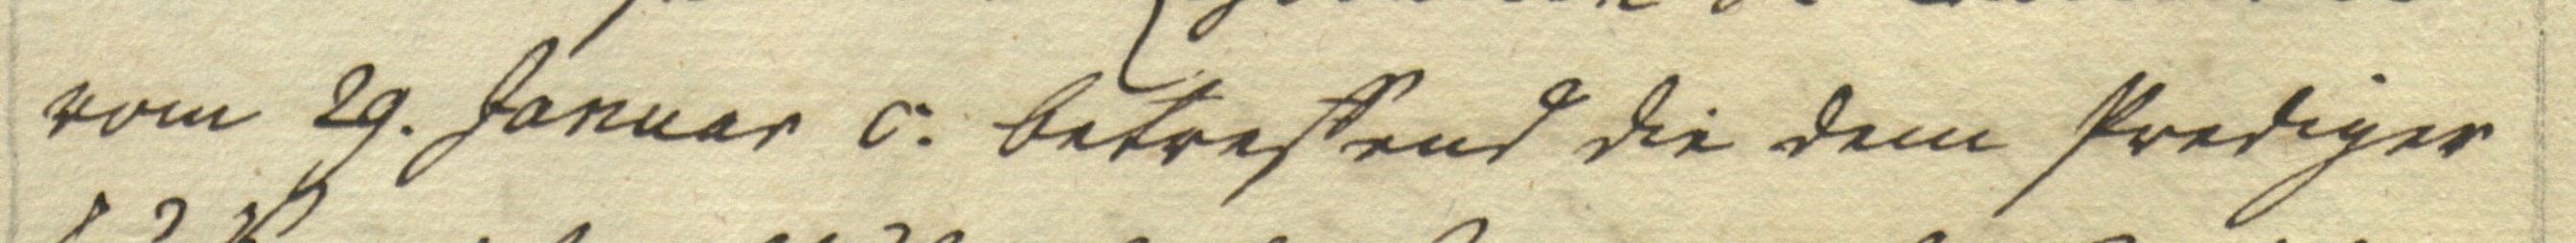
vom 29. Januar c. betreffend die dem Prediger
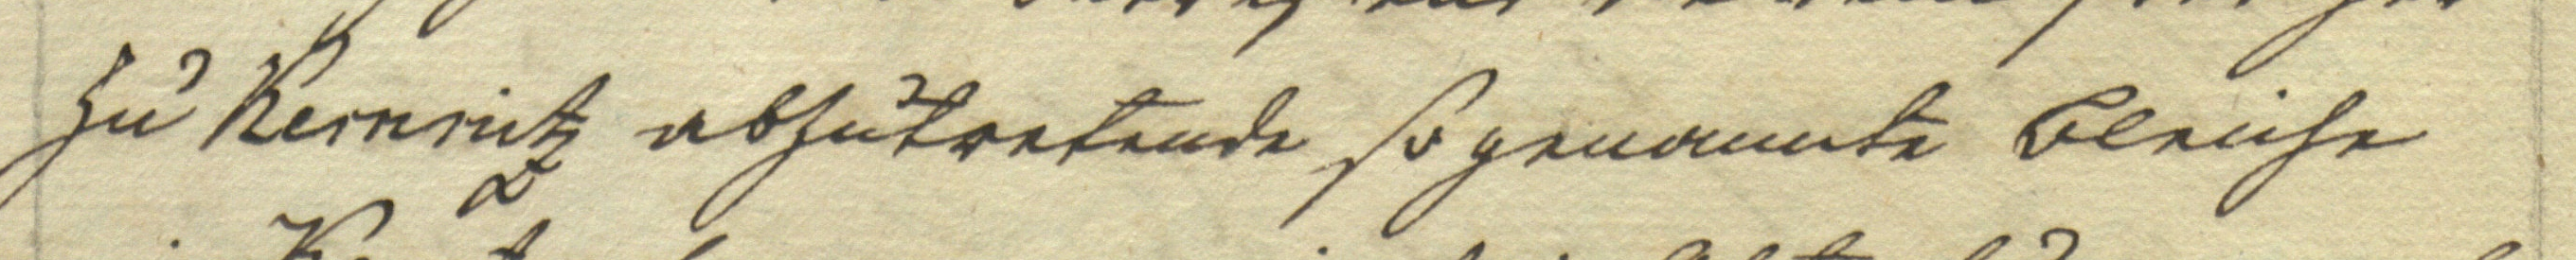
zu Kemnitz abzutretende so genannte Bleiche
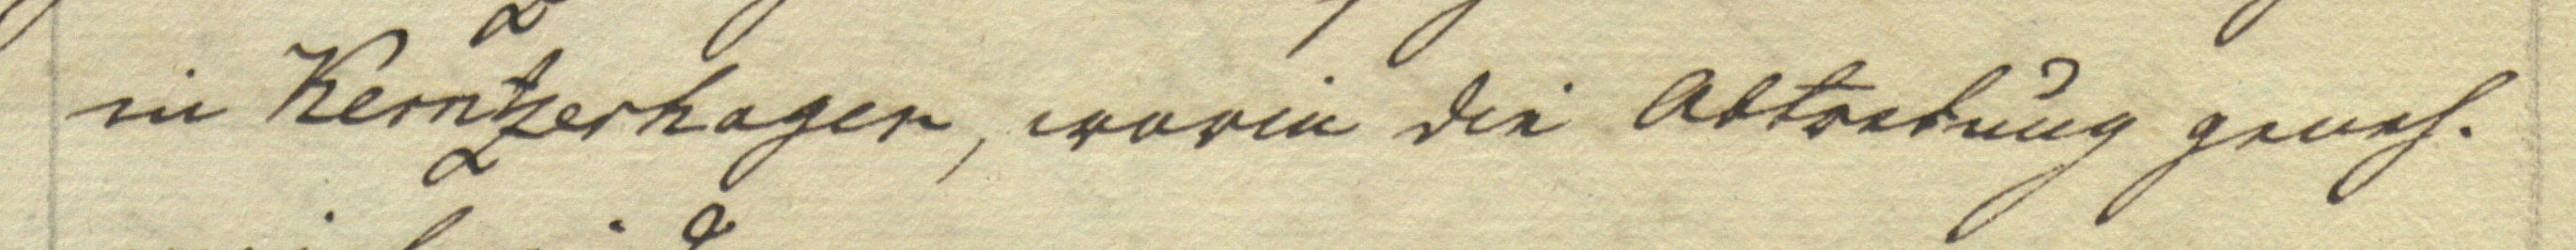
im Kemtzerhagen, worin die Abtretung geneh¬
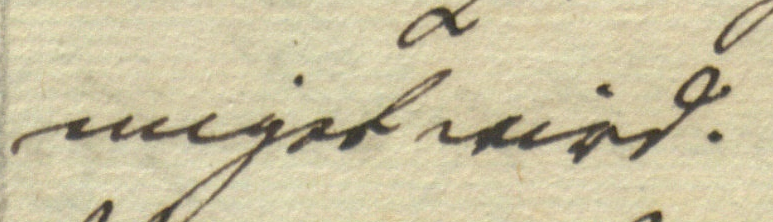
miget wird.
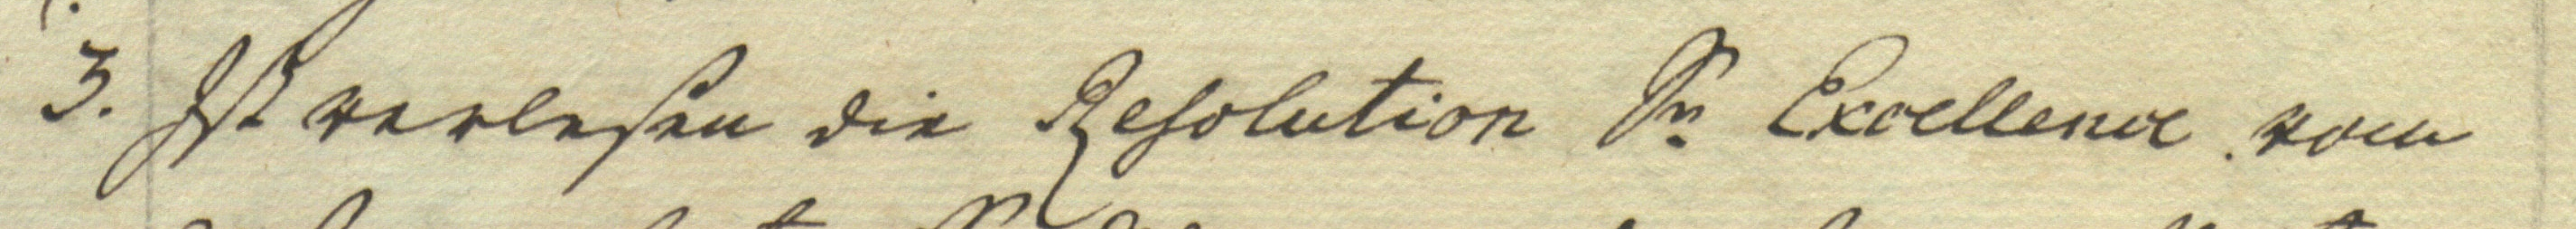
3. Ist verlesen die Resolution Sr Excellence vom
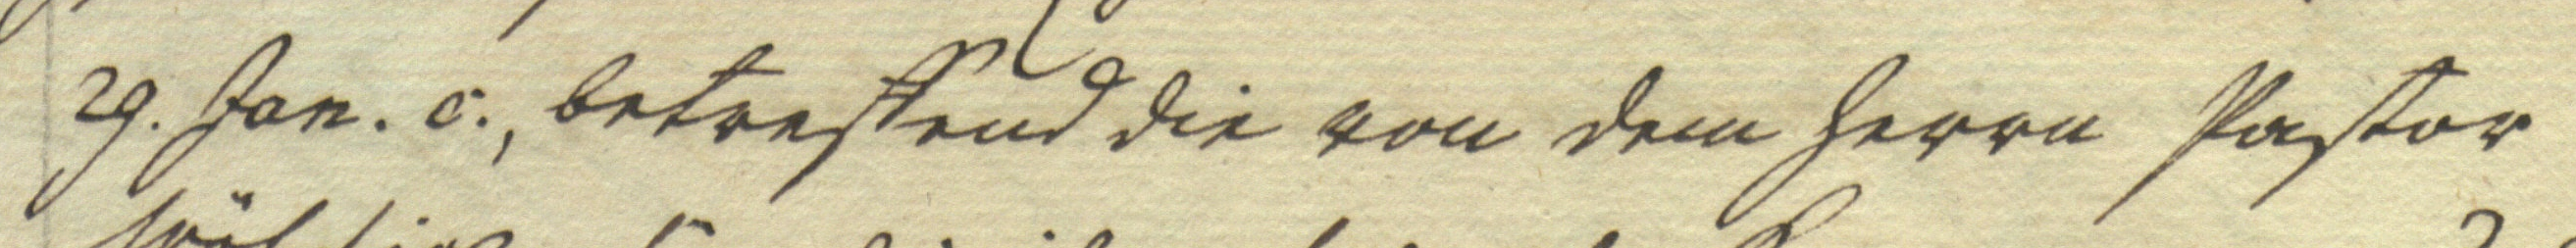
29 Jan. c. betreffend die von dem Herrn Pastor
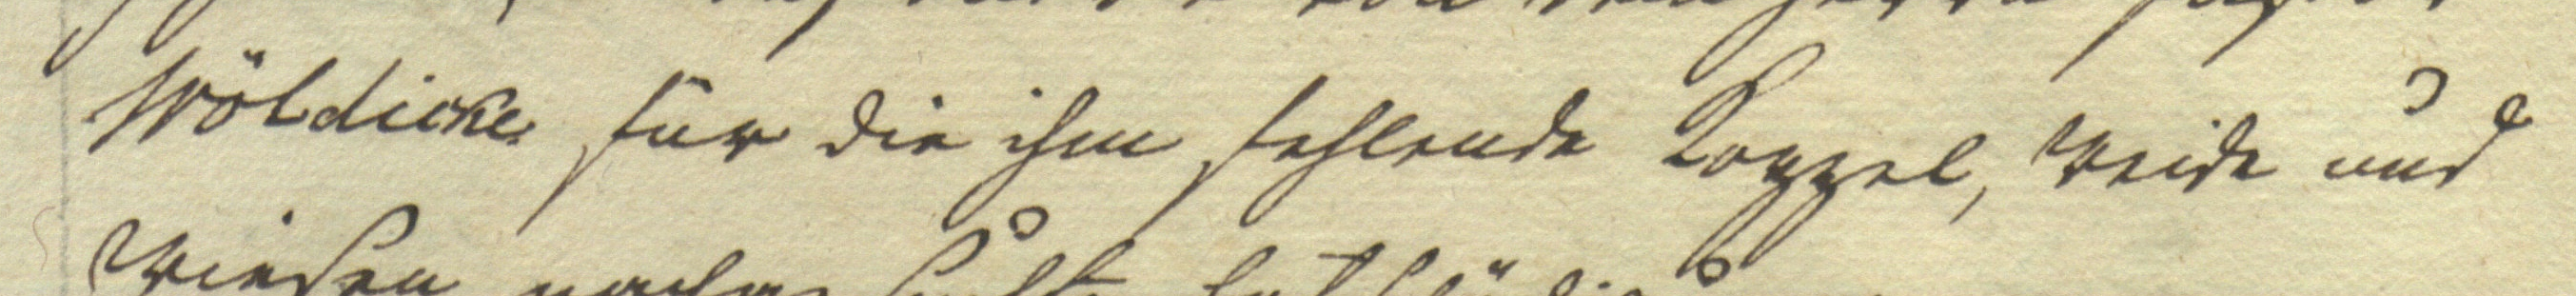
Wöldicke für die ihm fehlende Koppel, Weide und
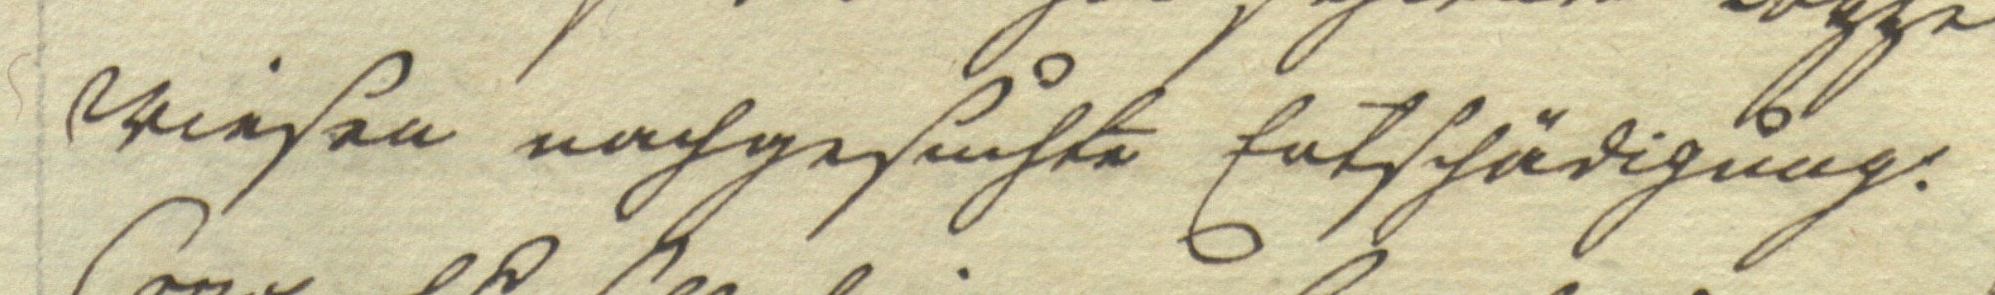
Wiesen nachgesuchte Entschädigung.
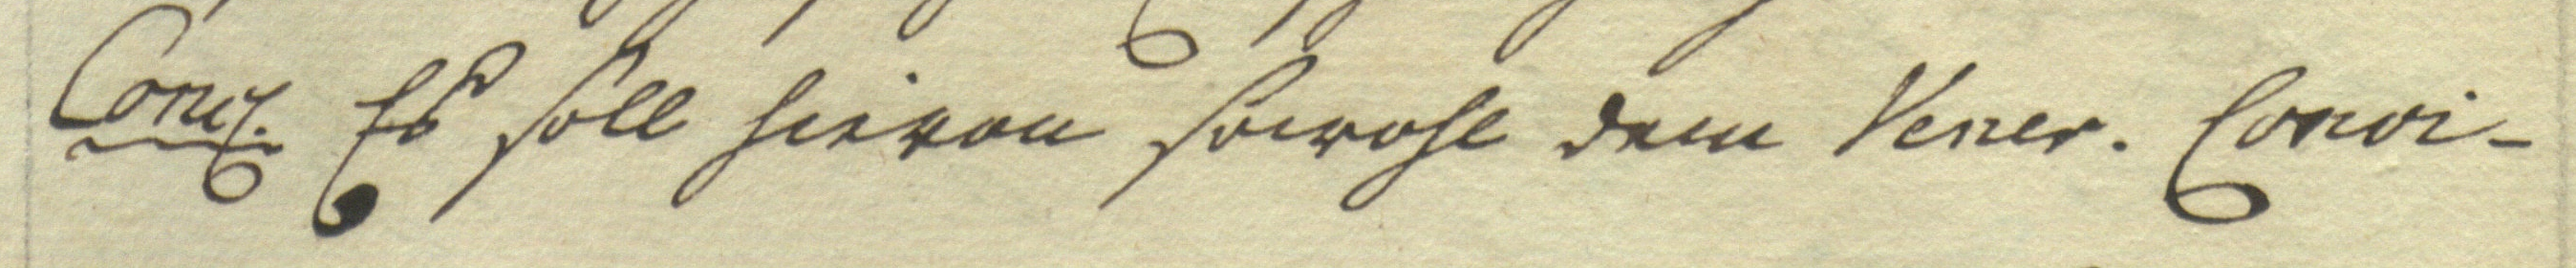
Concl. Es soll hievon sowohl dem Vener. Conci¬
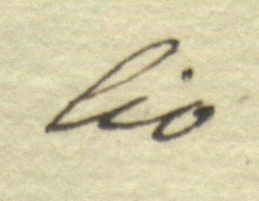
lio
